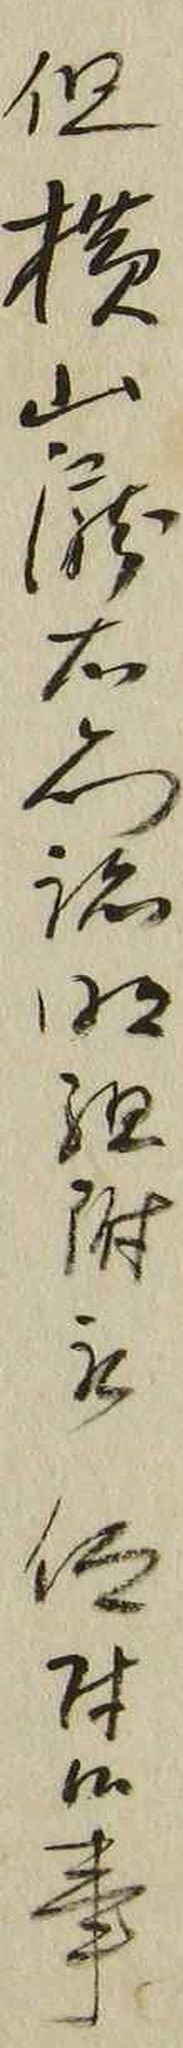但横山瀧右衛門跡明組附被仰付候事
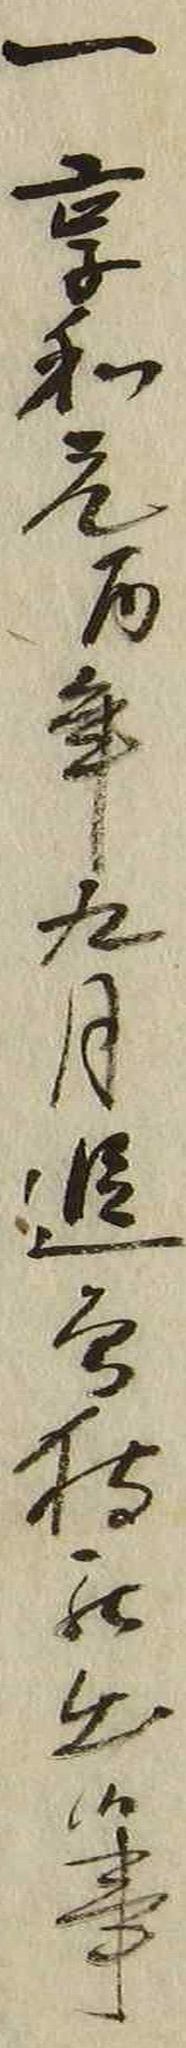一享和元酉年九月追鳥狩被出候事
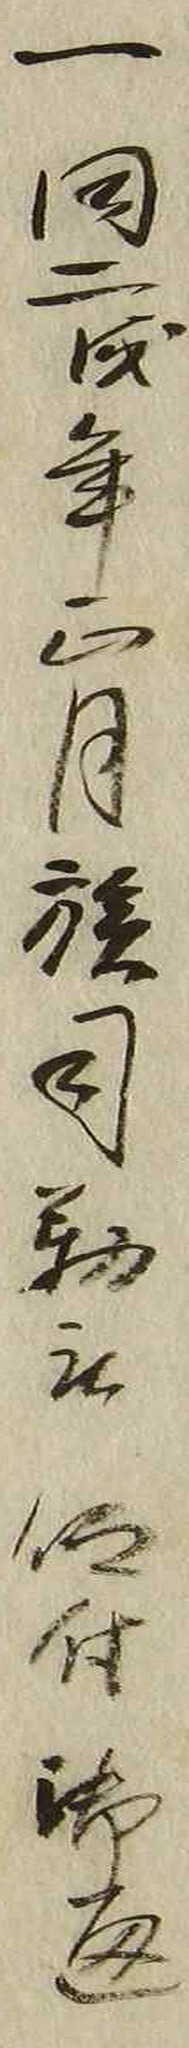一同二成年正月旗司勤被仰付御通
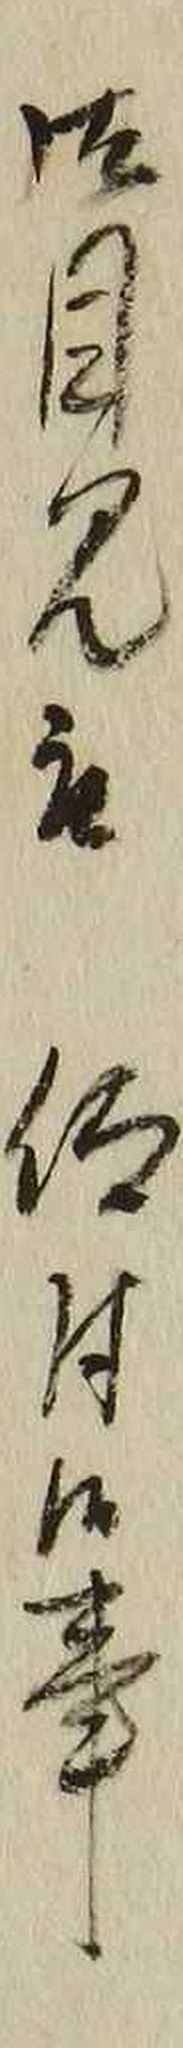御目見被仰付候事
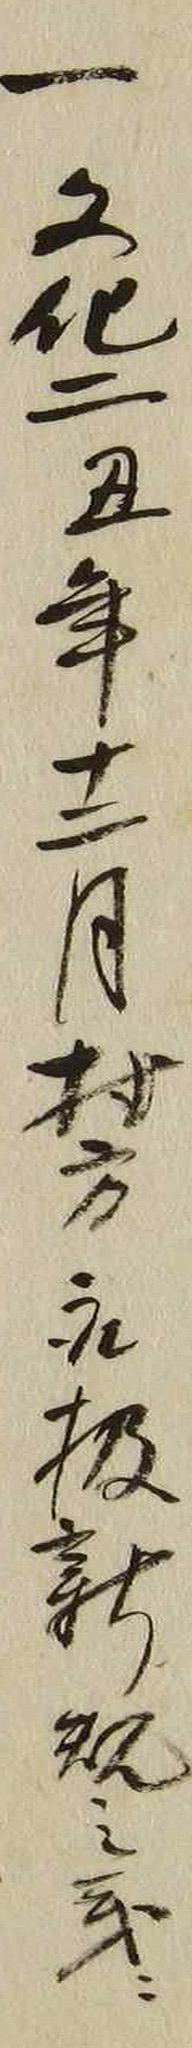一文化二丑年十二月村方取扱新規之義ニ
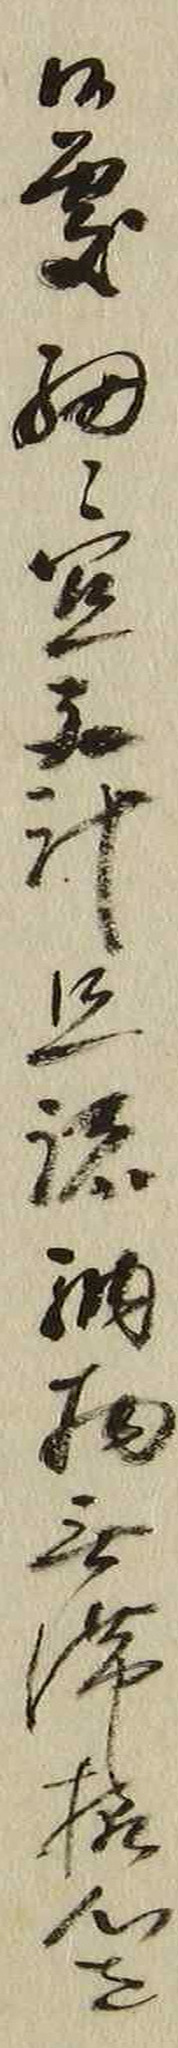候処細々宜取計且諸納物無滞様心を
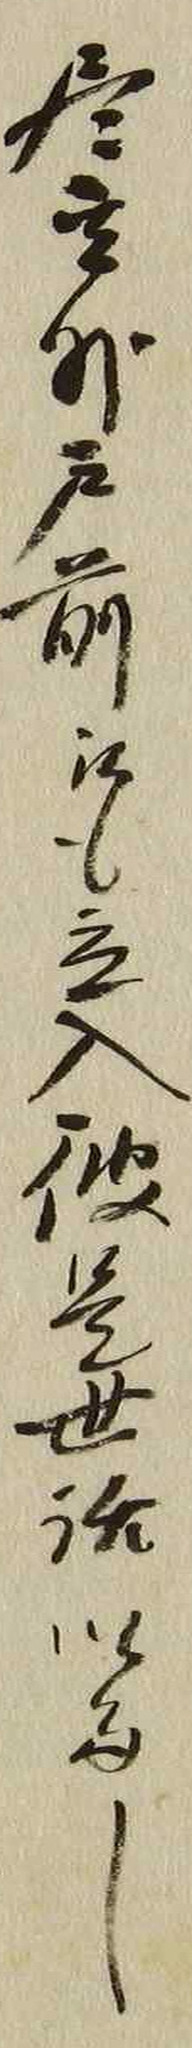尽其外戸前江も立入彼是世話いたし
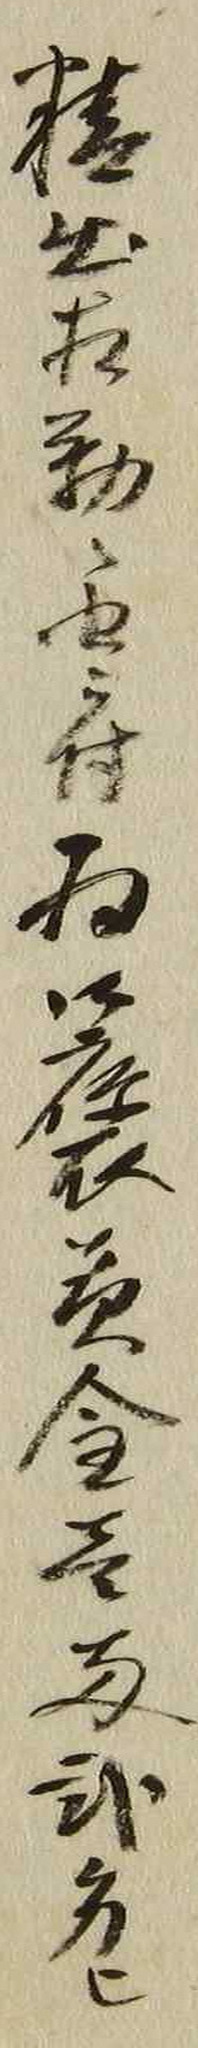精出相勤候由ニ付為御褒美金壱匁弐分被
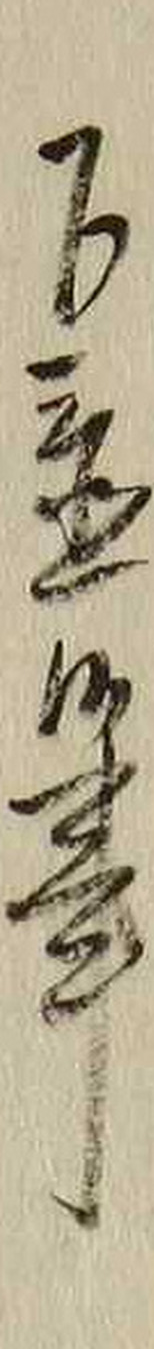下置候事
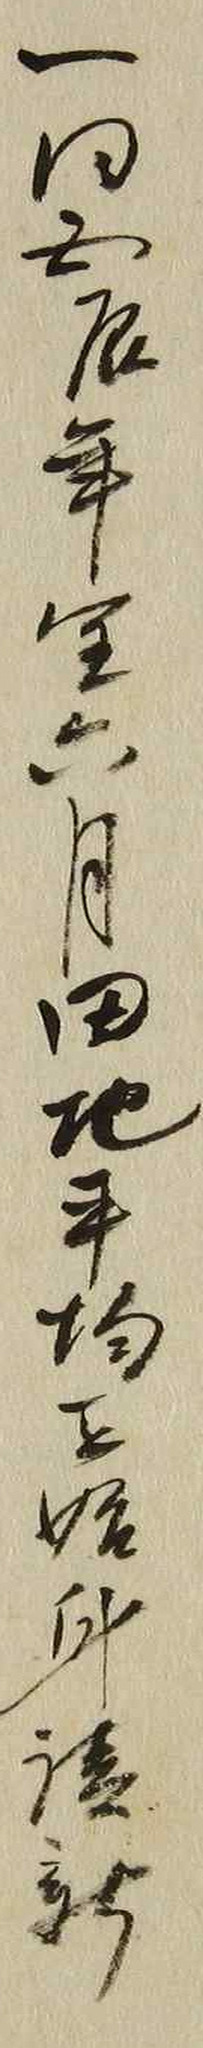一同五辰年閏六月田地平均を始身請新
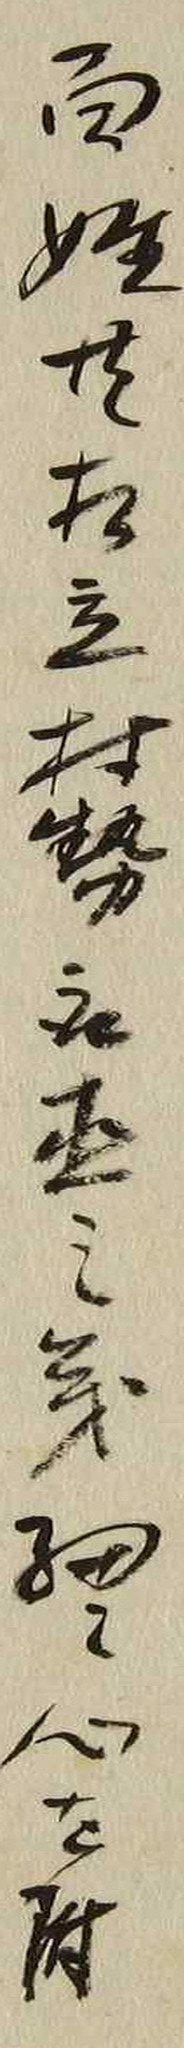百姓共相立村勢取直之義細々心を附
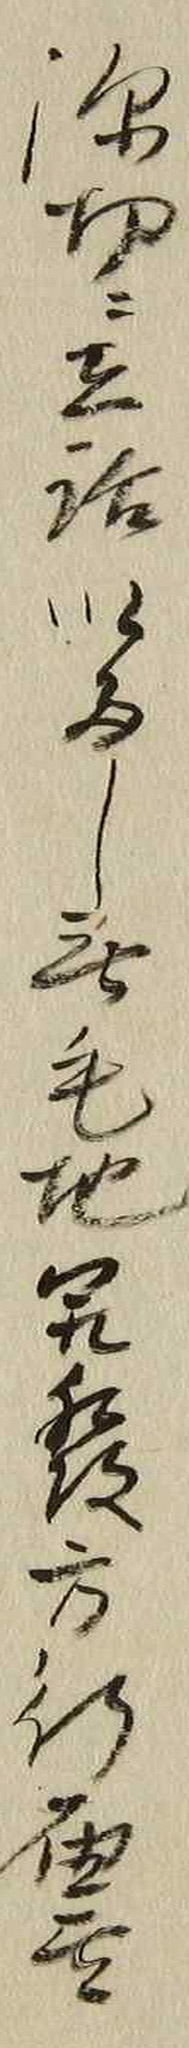深切ニ世話いたし無毛地開発方行届其
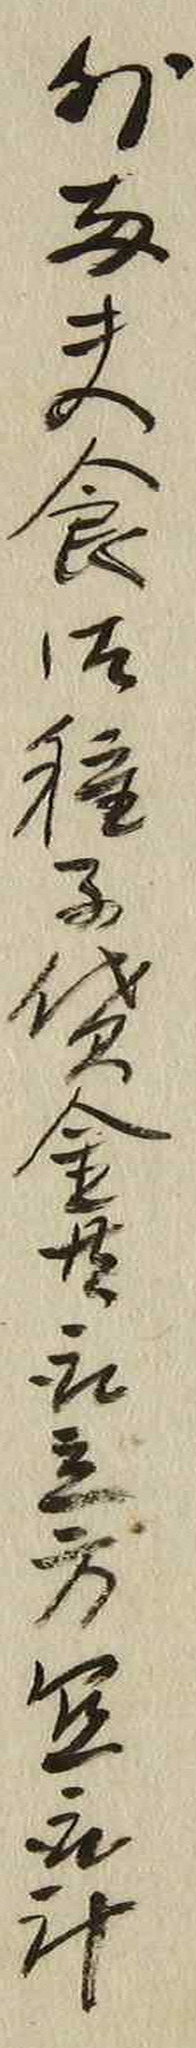外両夫食御種子貸金共取立方宜取計
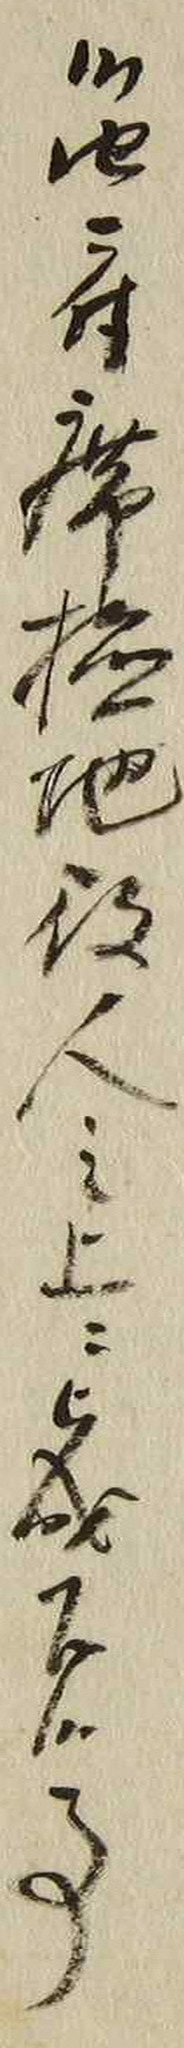候由ニ付席検地役人之上ニ成被下候事
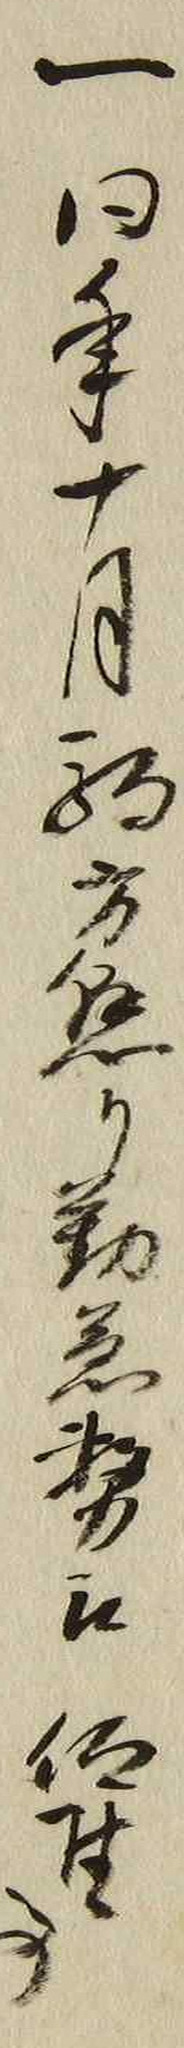一同年十月駒方懸り勤兼務被仰付候事
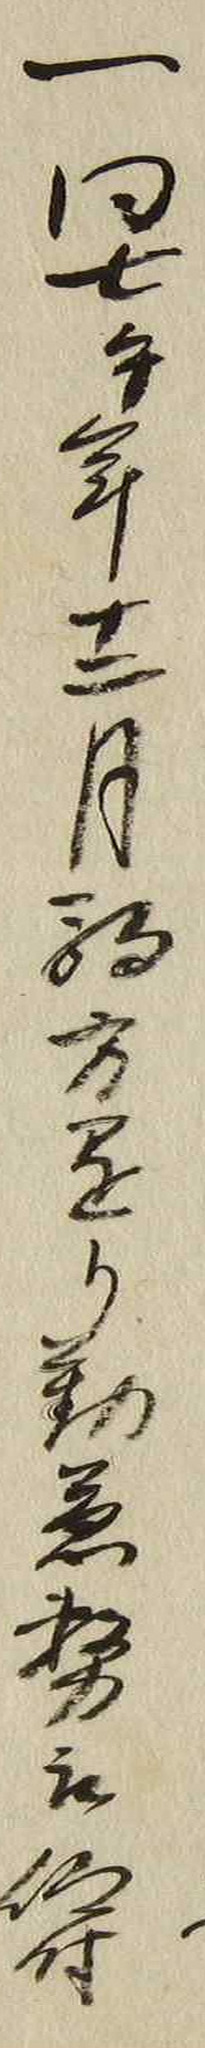一同七午年十二月駒方懸り勤兼務被仰付
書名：諸士系譜　巻之360　す之部10
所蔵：会津若松市立会津図書館
